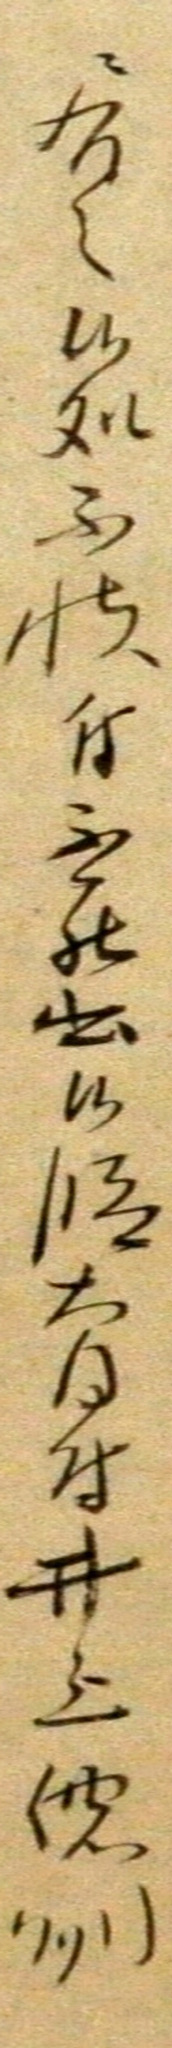ニ有之候処不快付不罷出候段大目付井上濃州
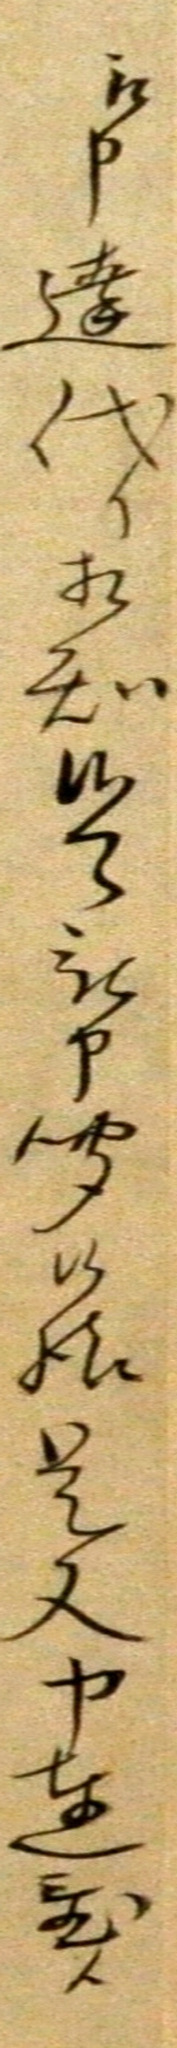被申達代り相知候ハヽ被申聞候様是又申達置候
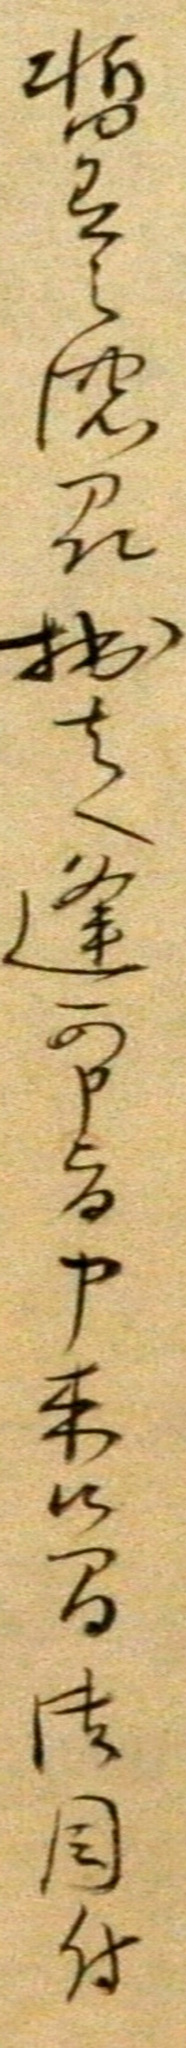暫有之濃州拙者へ逢可申旨申来候間御目付
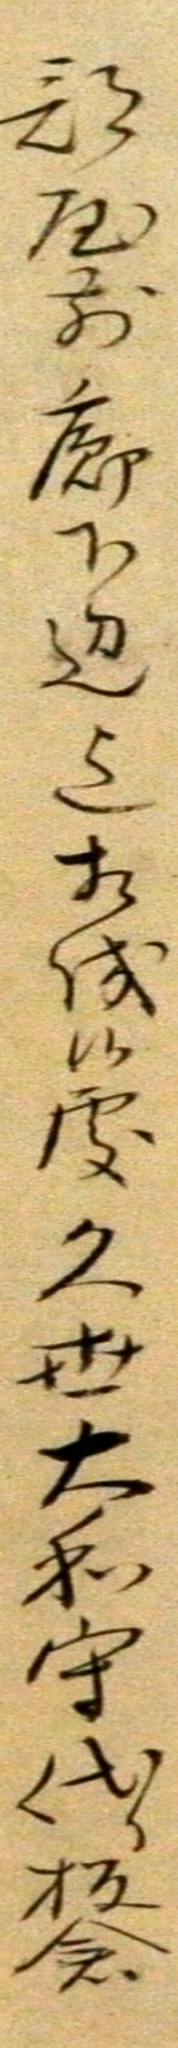部屋前廊下辺迄相越候處久世大和守代り板倉
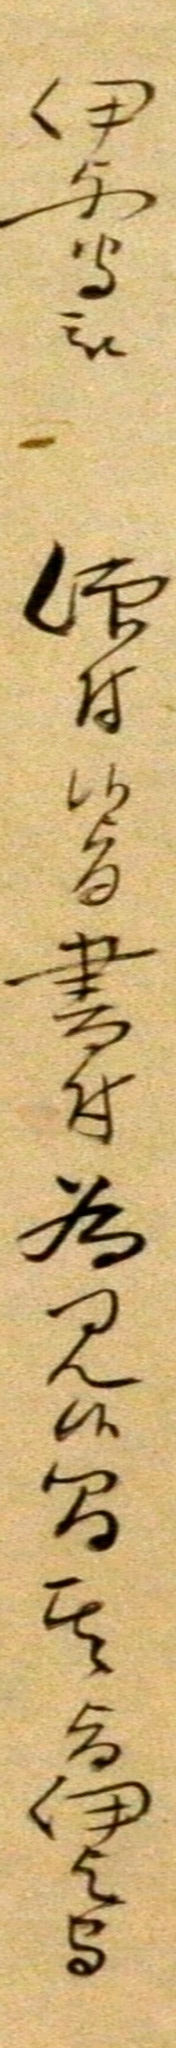伊与守被仰付候旨書付為見候間其旨伊与守
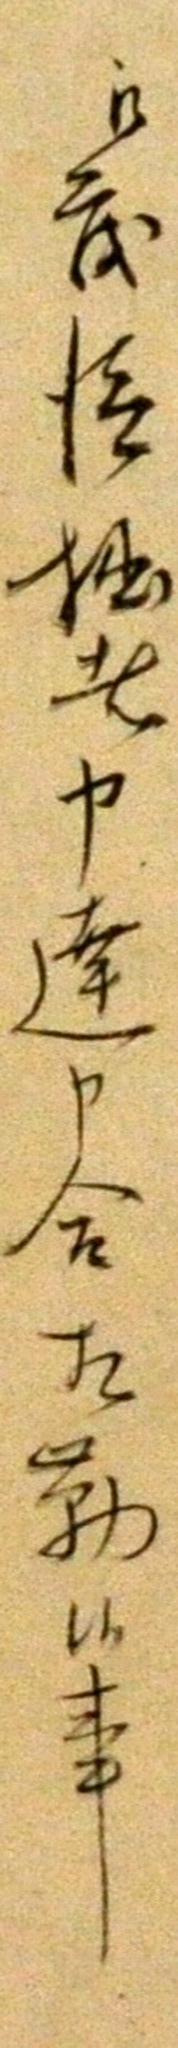えも従拙者申達申合相勤候事
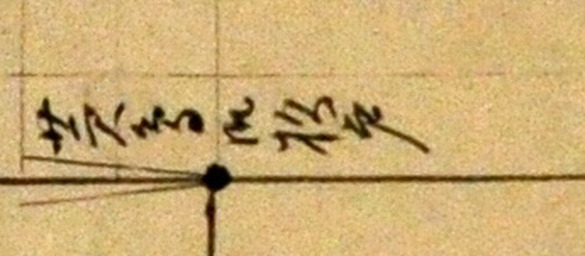黄鳥御杉戸
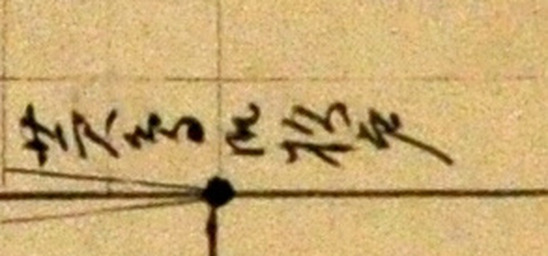黄鳥御杉戸
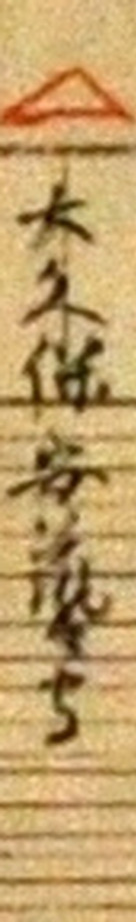△大久保安藝守
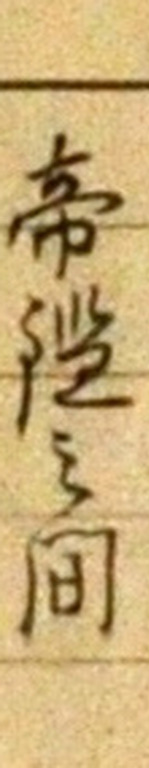帝鑑之間
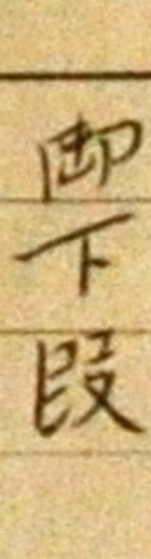御下段
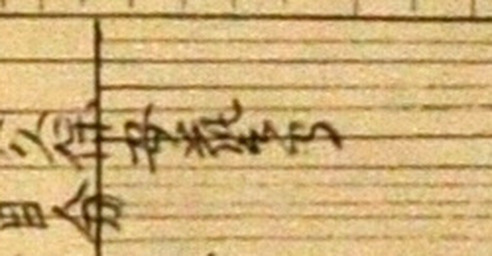△大久保安藝守
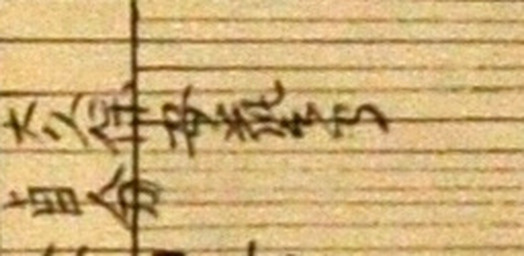△大久保安藝守
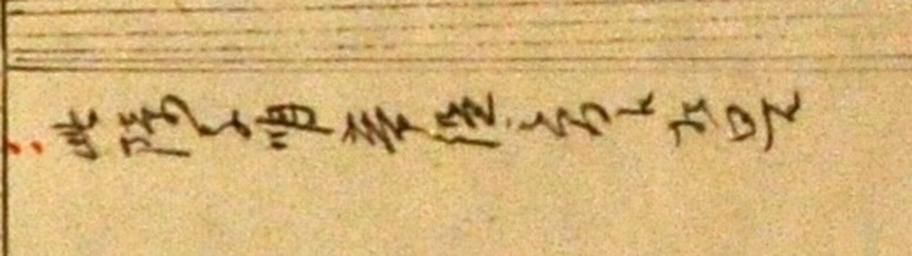此障子明帝鑑之間え相廻ル
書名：御白書院御座席奉行勤方留外
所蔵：伊那市立高遠町図書館・合同会社AMANE
